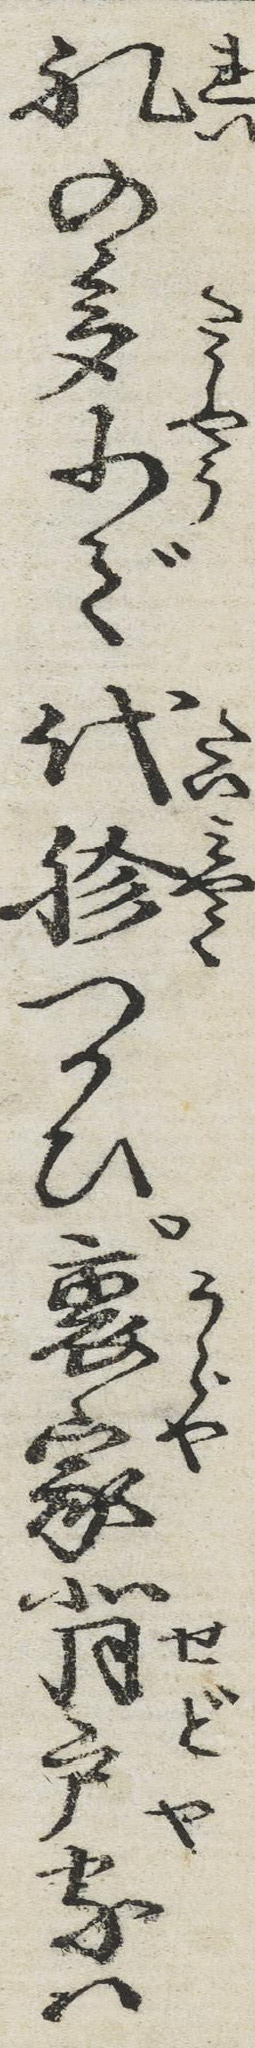礼の多少で代脈つかひ。裏家背戸家は
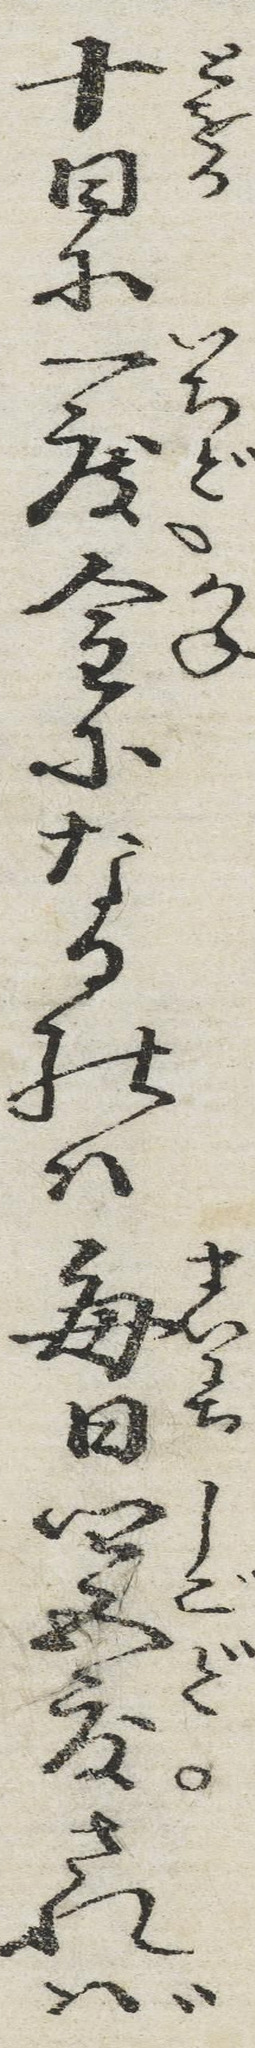十日に一度。金になるのは毎日四五度。されば
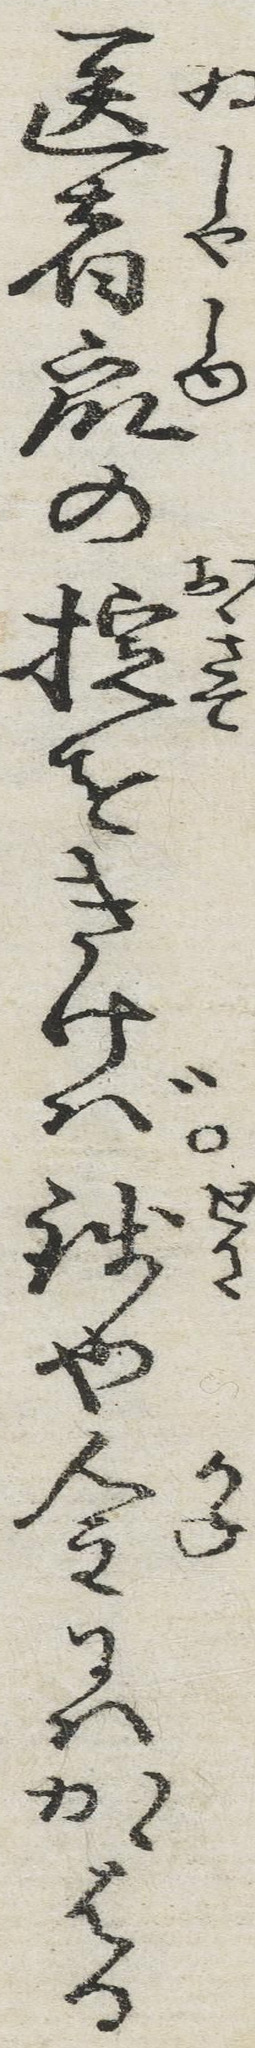医者衆の掟をきけば。銭や金にはかかはる
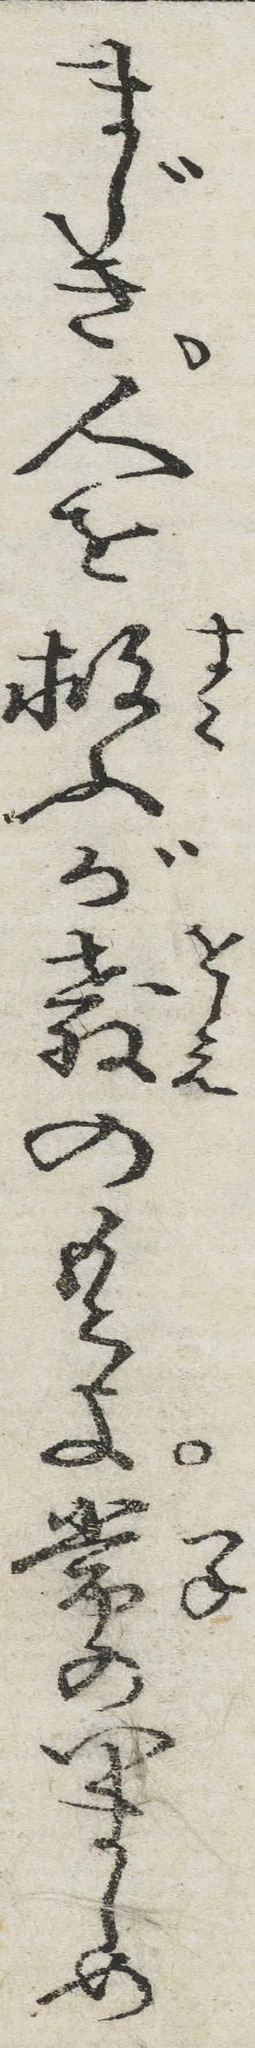まじき。人を救ふが教のもとよ。常のいましめ
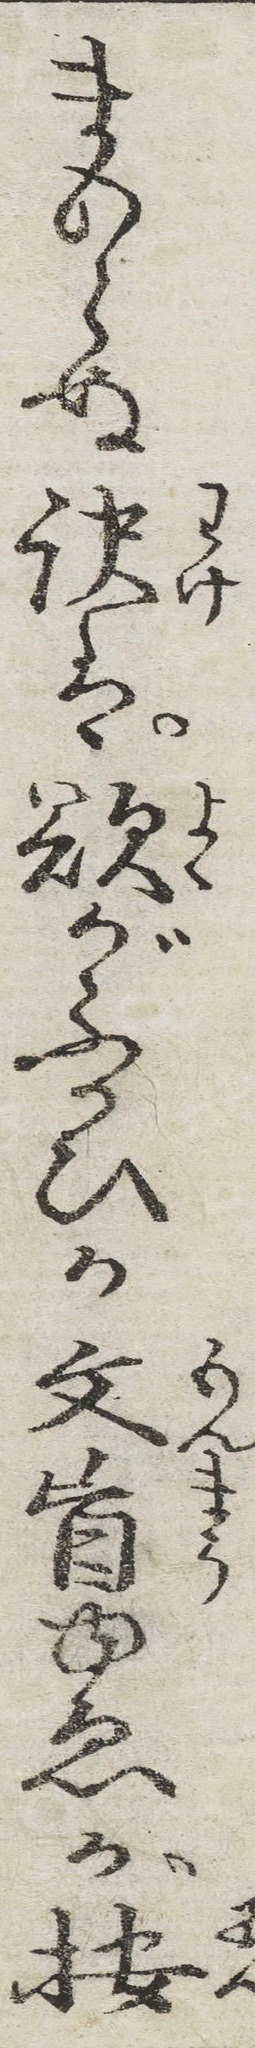まもらぬ訳は。欲がふかひか文盲ゆゑか。按
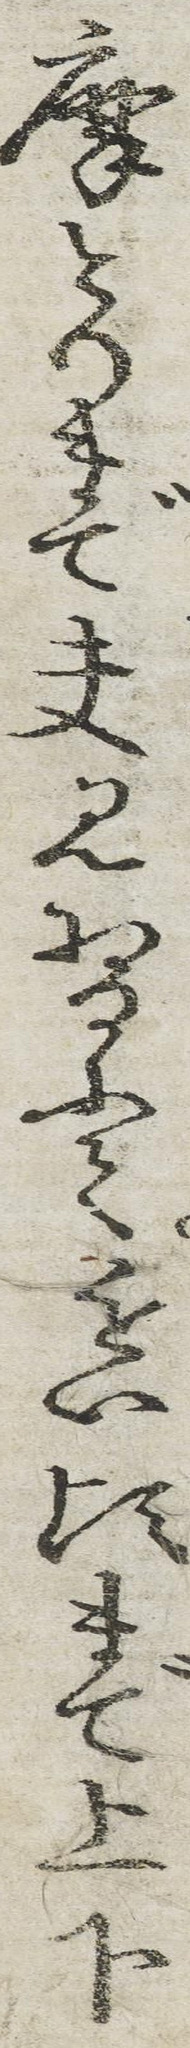摩とのまで夫見習ふて。近い頃まで上下
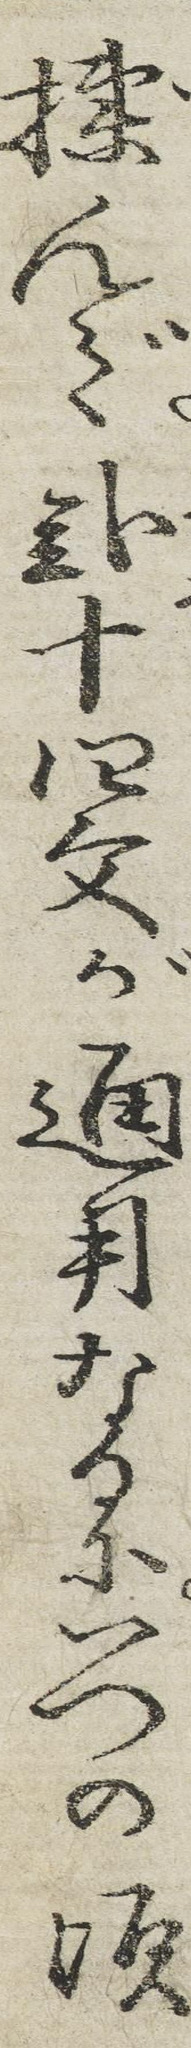揉んで。弐十四文が通用なるに。いつの頃

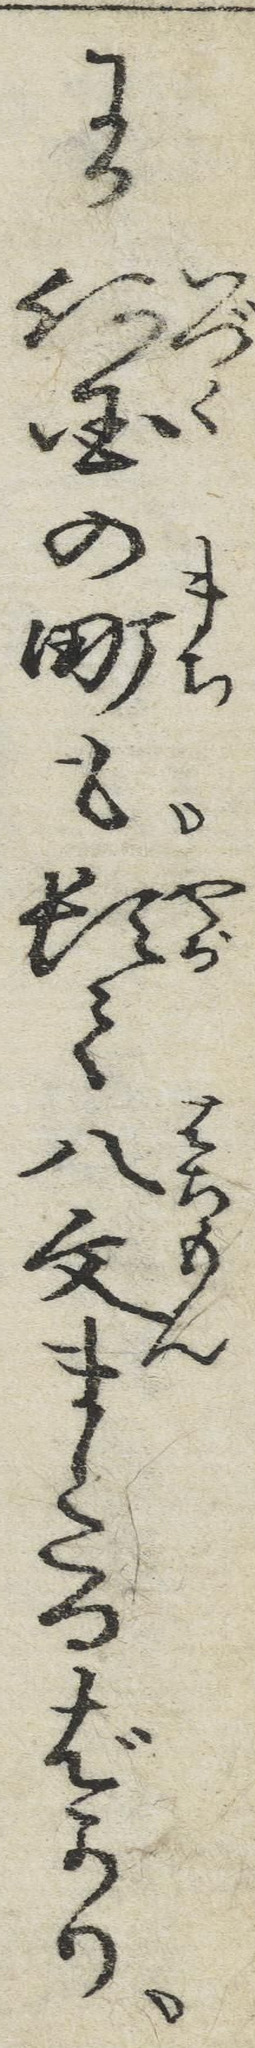より何国の町も。頓て八文ましたるばかり。
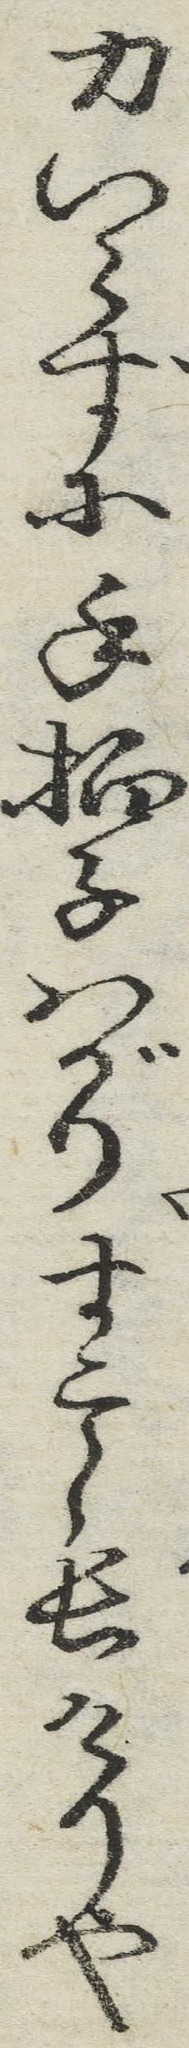力いらずに手拍子はがり。すこし長けりや
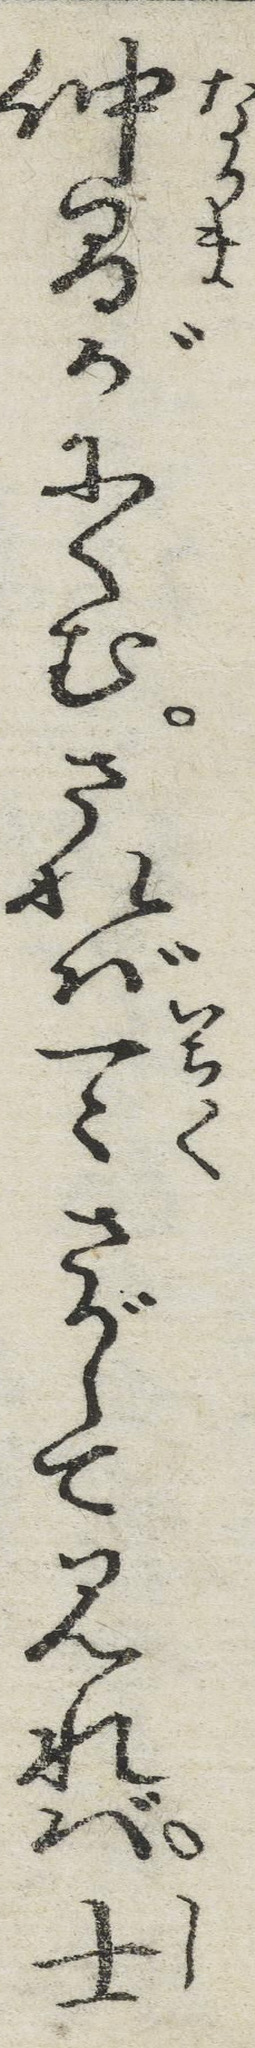仲間がにくむ。されば一々さがして見れば。士
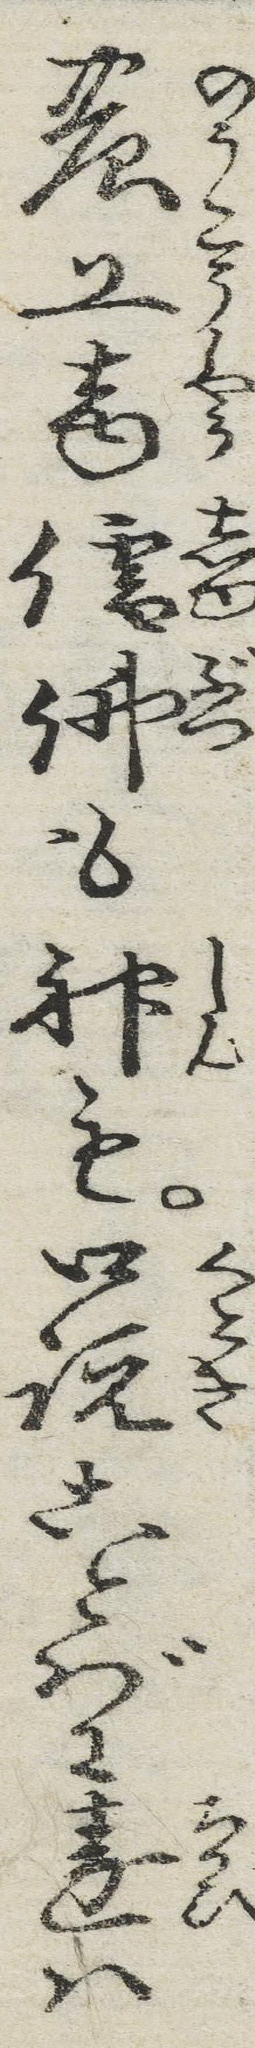農工商儒仏も神も。口説ことばに違は
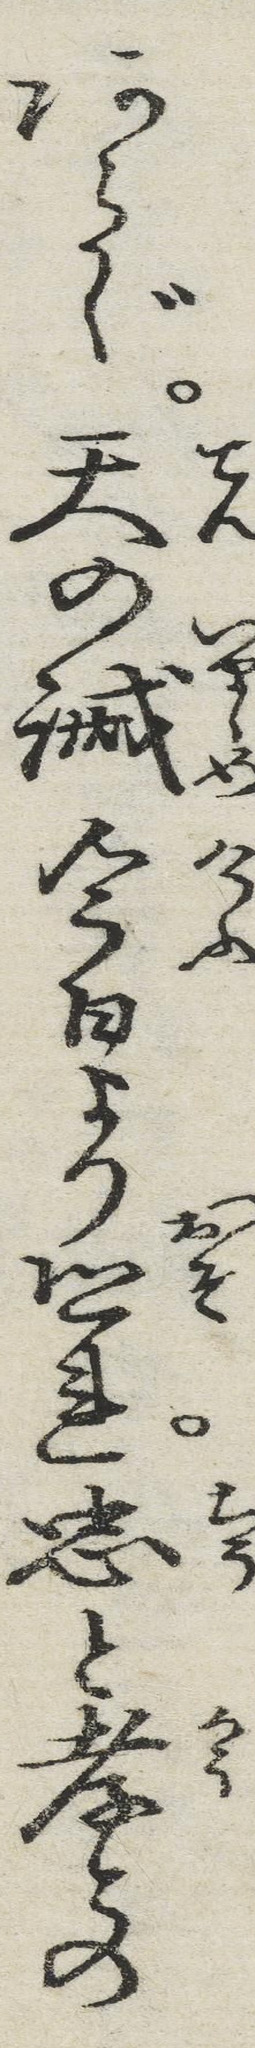あらじ。天の誡今日より恐れ。忠と孝との
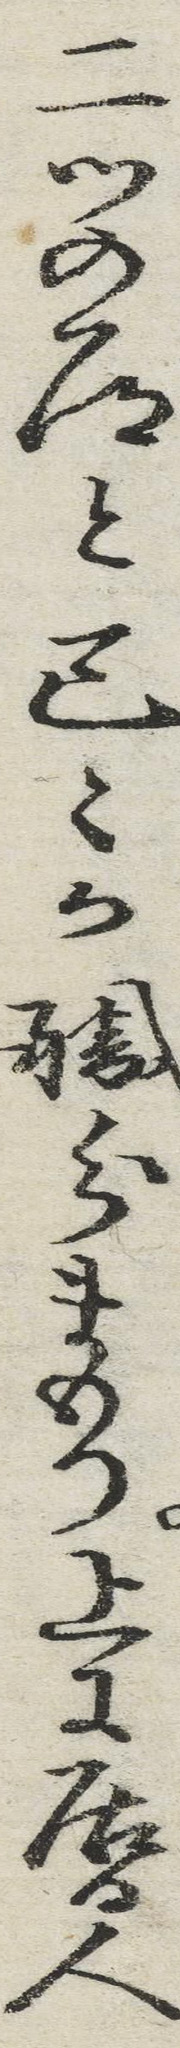二つの道と。己〻が職分まもり。上に居る人
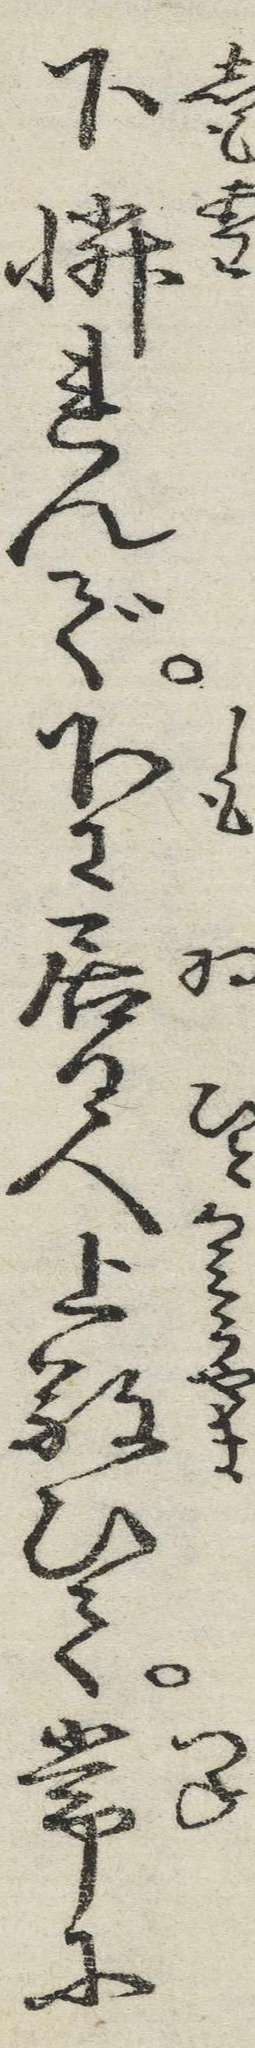下憐れんで。下に居る人上敬いて。常に
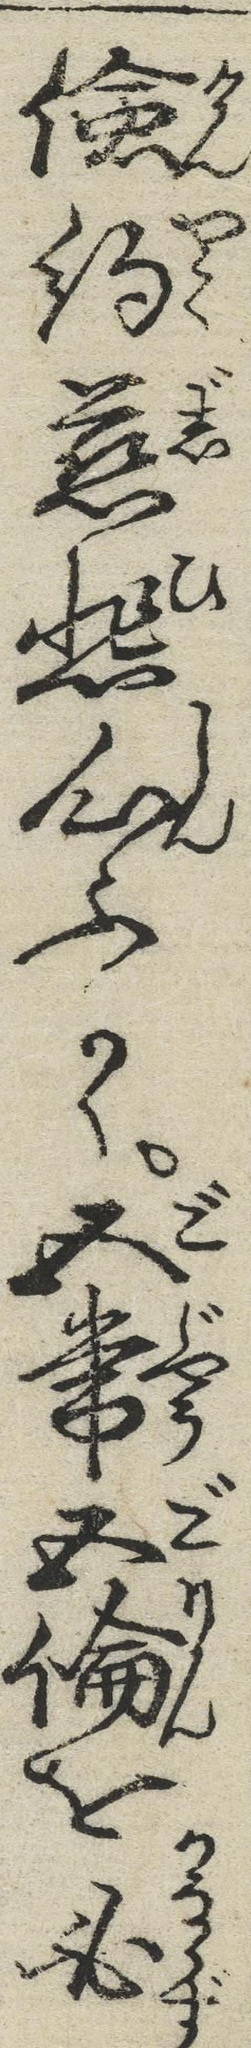倹約慈悲心ふかく。五常五倫を必
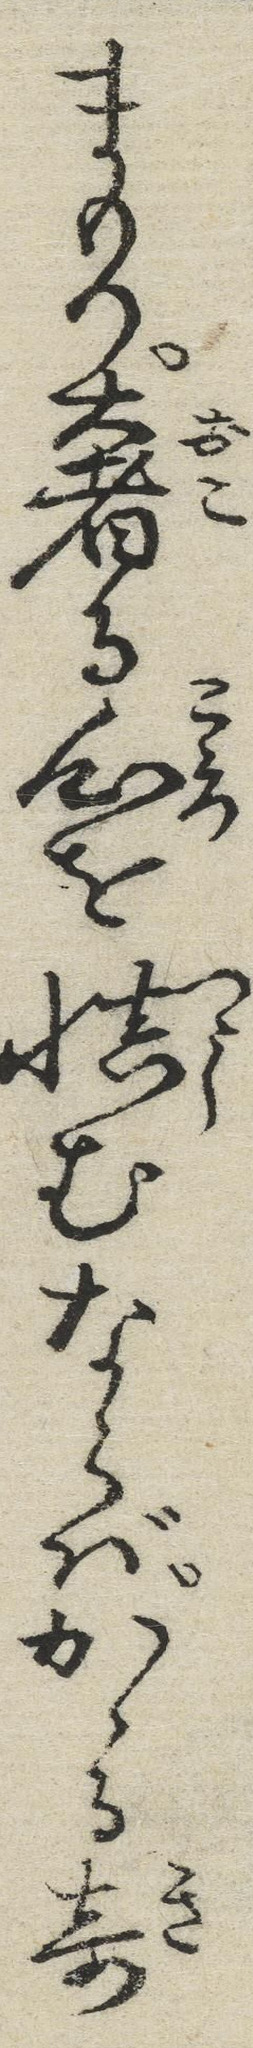まもり。奢る心を慎むならは。かゝる奇
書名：越後地震口説
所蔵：東京大学地震研究所図書室 Earthquake Research Institute Library, The University of Tokyo, JAPAN
